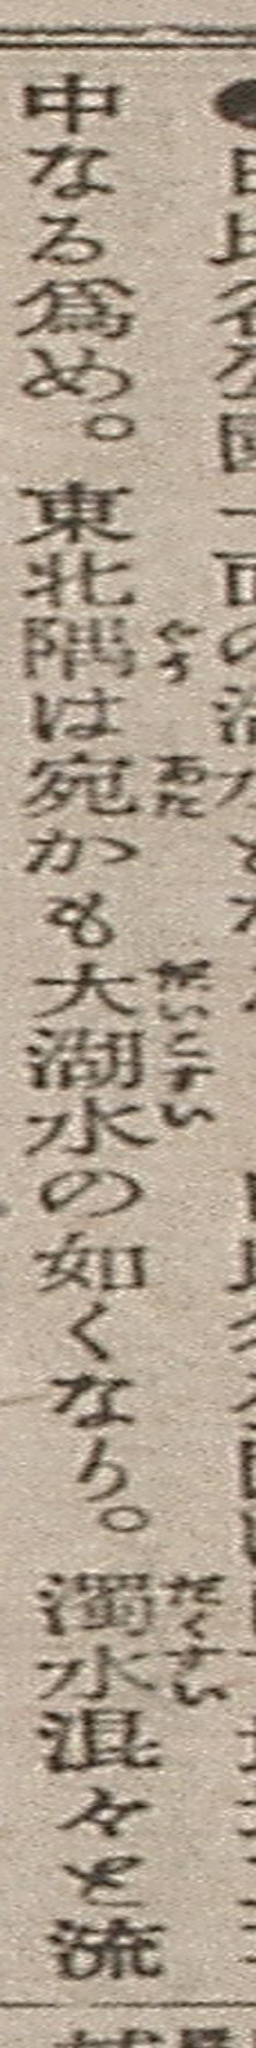中なる為め。東北隅は宛かも大湖水の如くなり。濁水混々と流
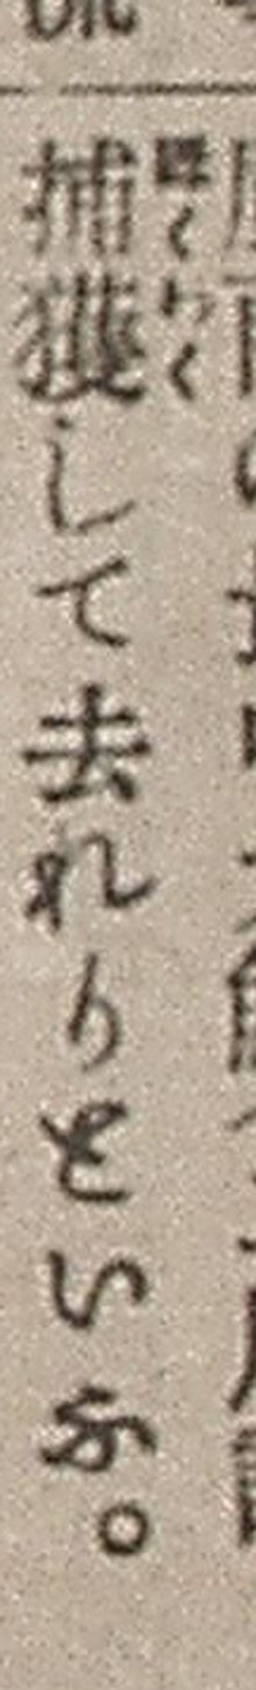捕獲して去れりといふ。
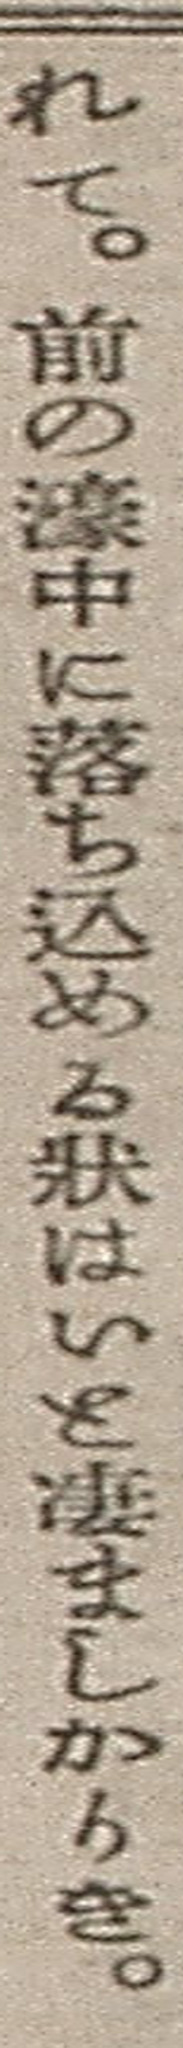れて。前の濠中に落ち込める状はいと凄ましかりき。
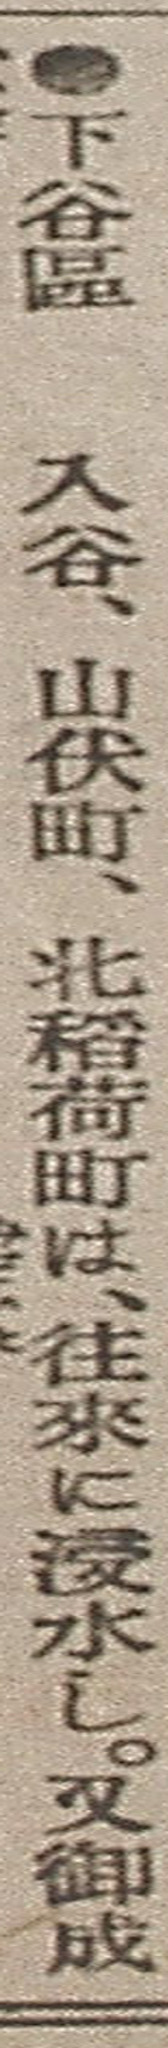●下谷区入谷、山伏町、北稲荷町は、往来に浸水し。又御成
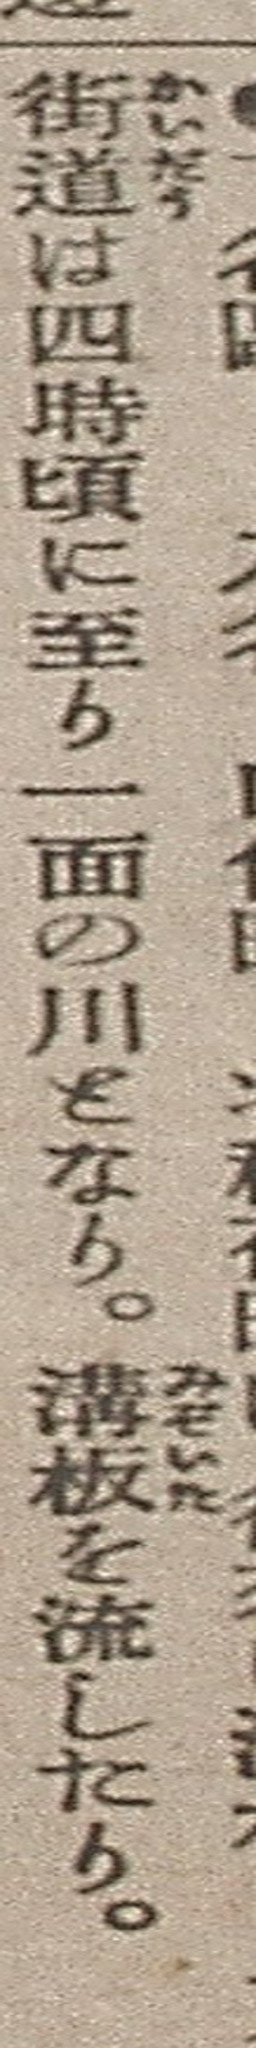街道は四時頃に至り一面の川となり。溝板を流したり。
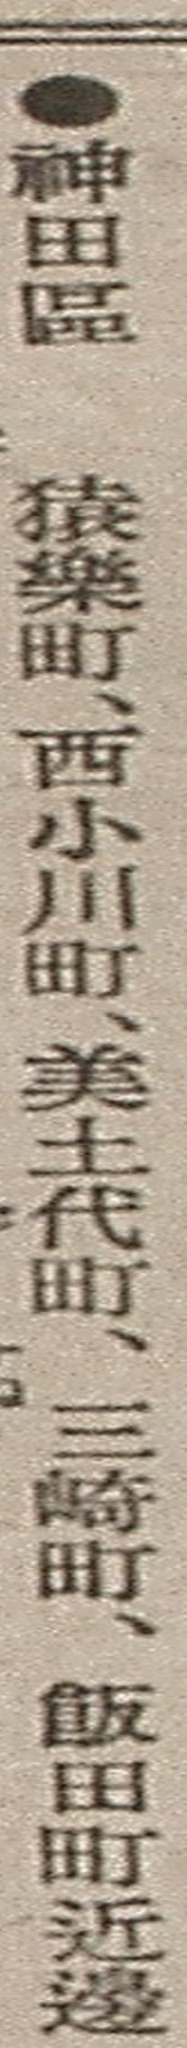●神田区猿楽町、西小川町、美土代町、三崎町、飯田町近辺
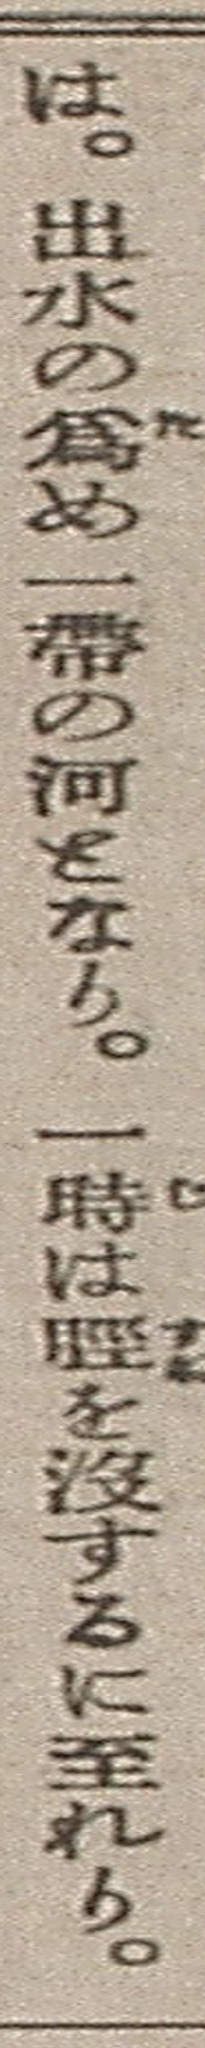は。出水の為め一帯の河となり。一時は脛を没するに至れり。
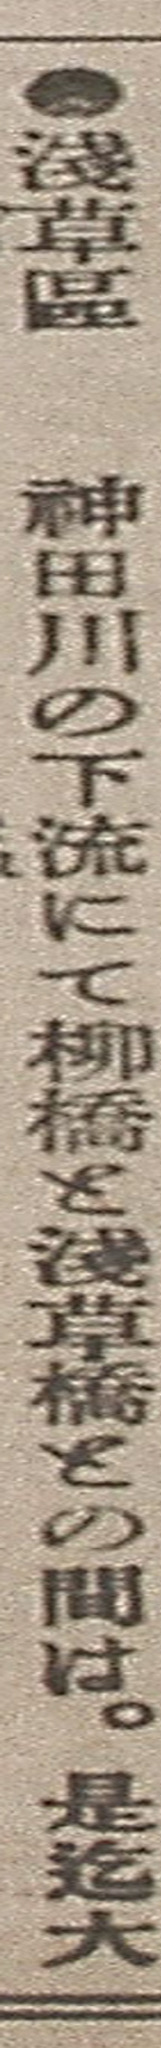●浅草区神田川の下流にて柳橋と浅草橋との間は。是迄大
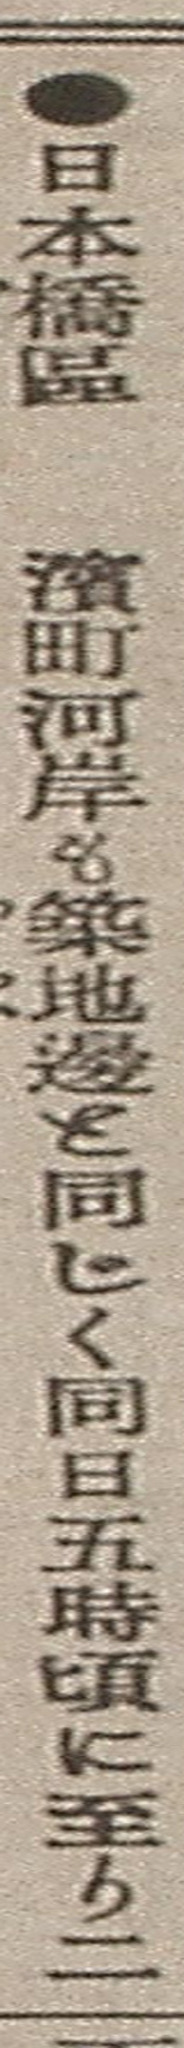●日本橋区濱町河岸も築地辺と同じく同日五時頃に至り二
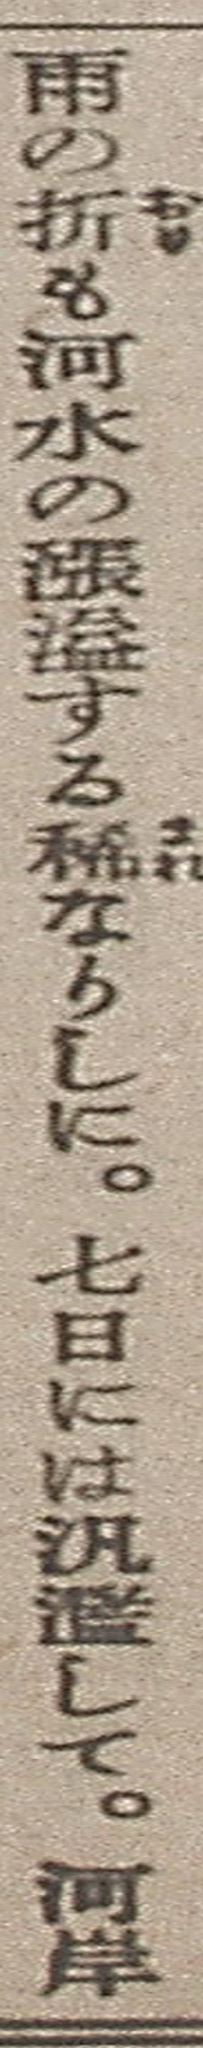雨の折も河水の漲溢する稀なりしに。七日には汎濫して。河岸
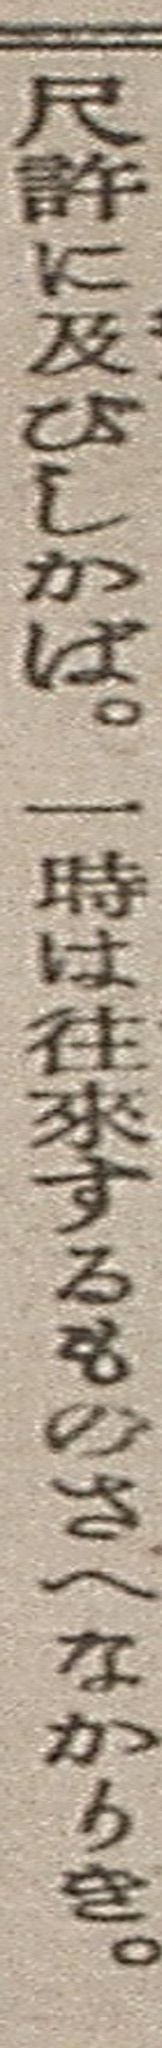尺許に及びしかば。一時は往来するものさへなかりき。
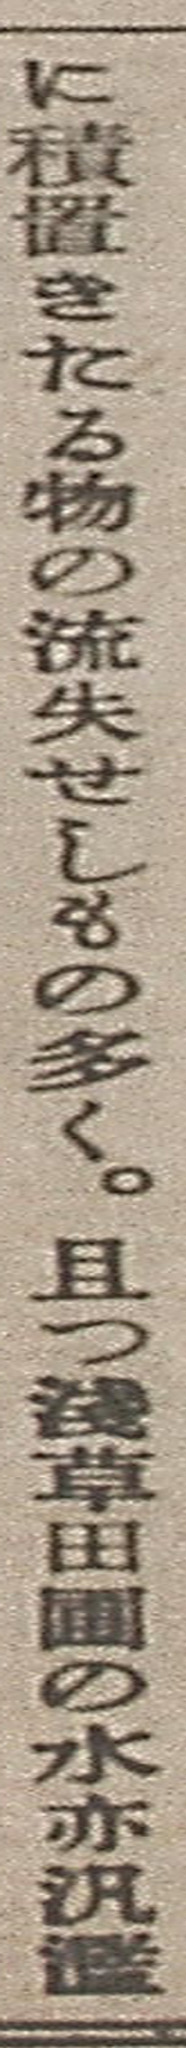に積置きたる物の流失せしもの多く。且つ浅草田圃の水亦汎濫
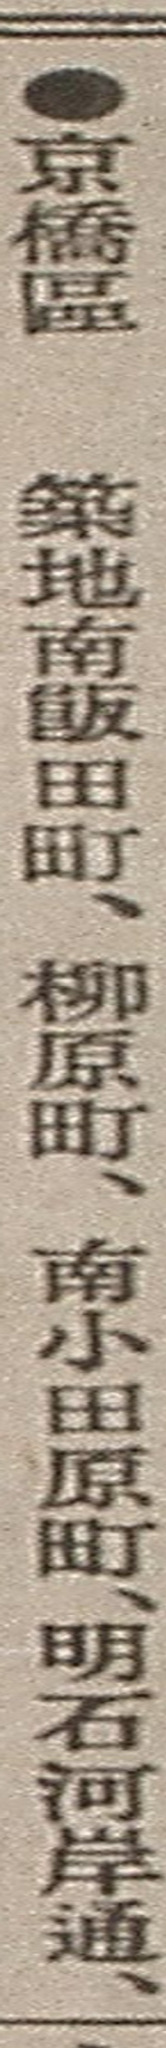●京橋区築地南飯田町、柳原町、南小田原町、明石河岸通、
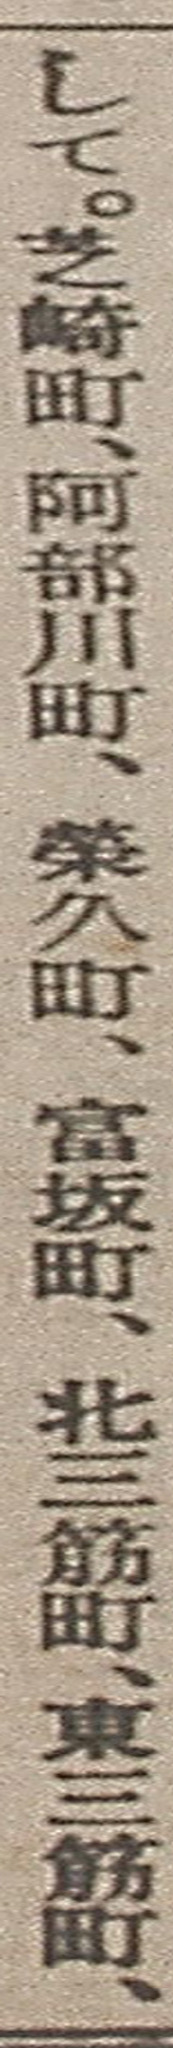して。芝崎町、阿部川町、栄久町、冨坂町、北三筋町、東三筋町、
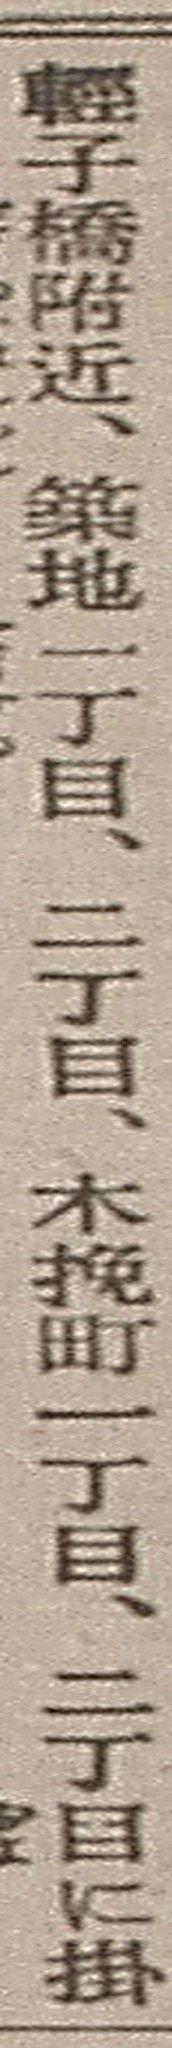軽子橋付近、築地一丁目、二丁目、木挽町一丁目、二丁目に掛
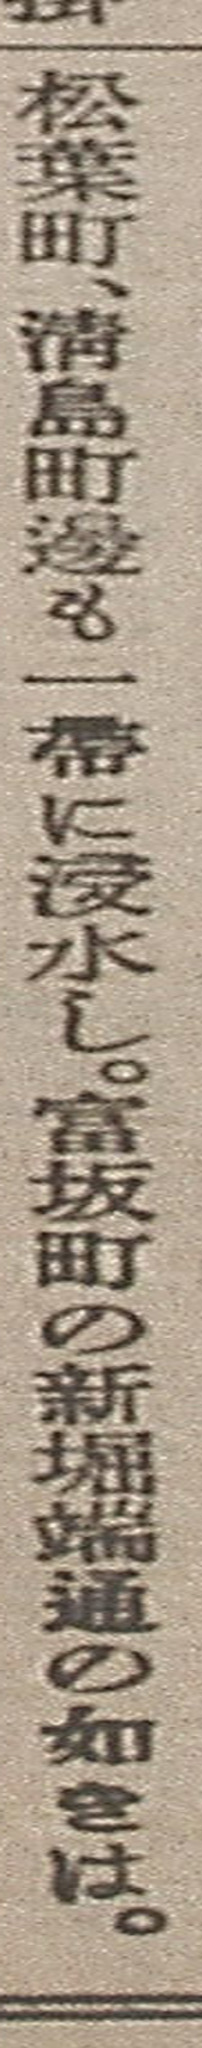松葉町、清島町辺も一帯に浸水し。冨坂町の新堀端通の如きは。
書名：風俗畫報臨時増刊第百九十九號　明治三十二年十月各地災害圖會（前編之續）
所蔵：東京大学地震研究所図書室 Earthquake Research Institute Library, The University of Tokyo, JAPAN
